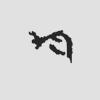旬
